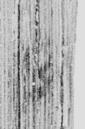女（汝）
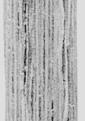安（焉）
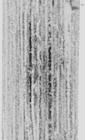能
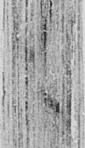也
